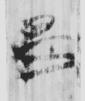是
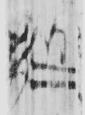從
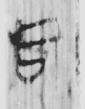句
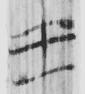王
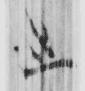之
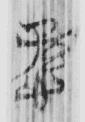愻
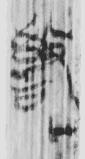{爻言攴}
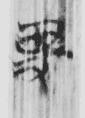卑
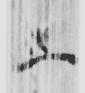之
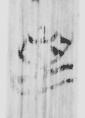若
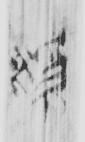溪
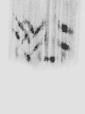浴
